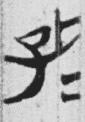孔子
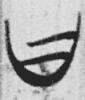曰
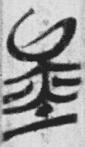○（舜）
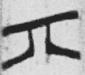亓（其）
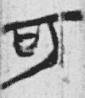可
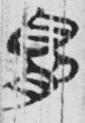{胃刀}（謂）
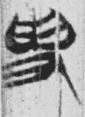受
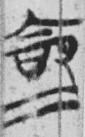命
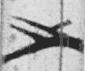之
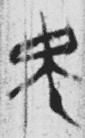民
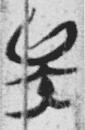矣
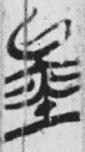○（舜）
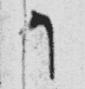人
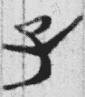子
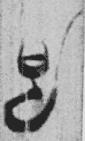也
